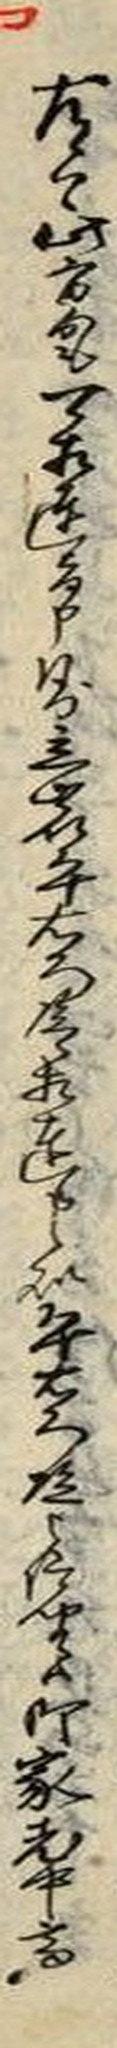左候ハヽ此方ゟも可相達旨申則立岩平右衛門殿へ相達申候処平右衛門殿被仰聞候は御家老中高

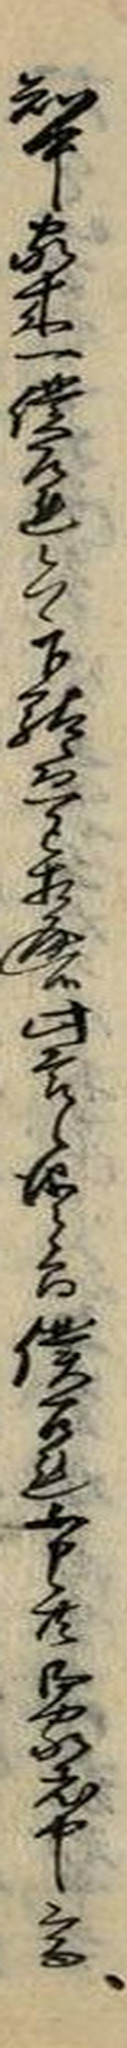知中之家来一僕召連候はゝ下駄に而可被相通候此節之儀に候間僕召連不申候共御家老中高
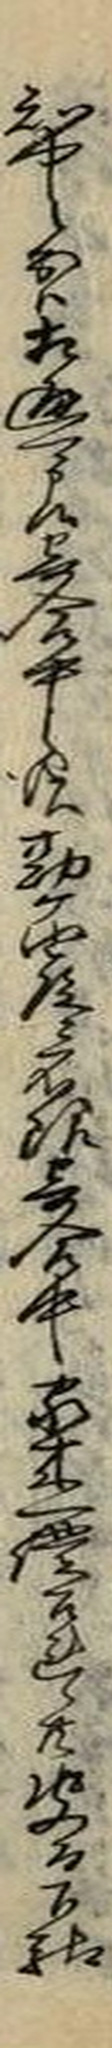知中之分は相通可申候寄合中之儀は勘ヶ由殿に不限寄合中家来一僕召連候共決而下駄
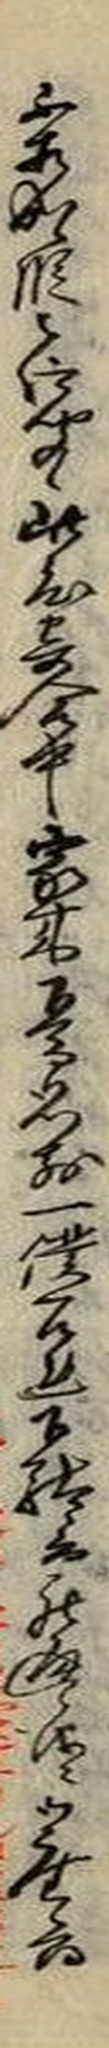不相成候段被仰聞候此度寄合中家来下馬御門於一僕召連下駄に而罷通候儀に御座候間
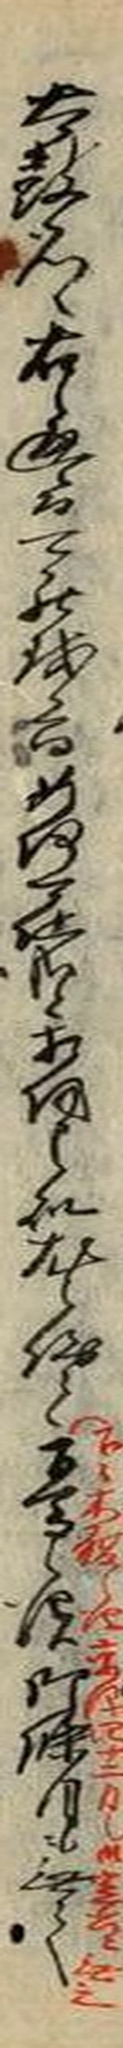太鼓御門へ右之通候而可罷越候間如何可仕哉に相伺候処尤之儀に候下馬之儀御条目も無之
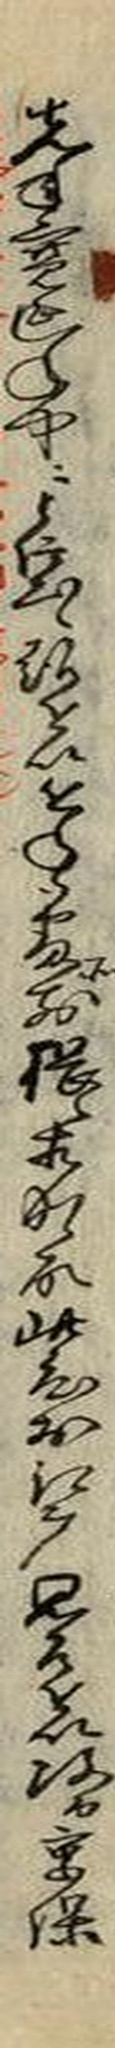先年寛延年中に被仰出候趣を以近年御番所於猥に相成候故此度於江戸思召を以改而享保
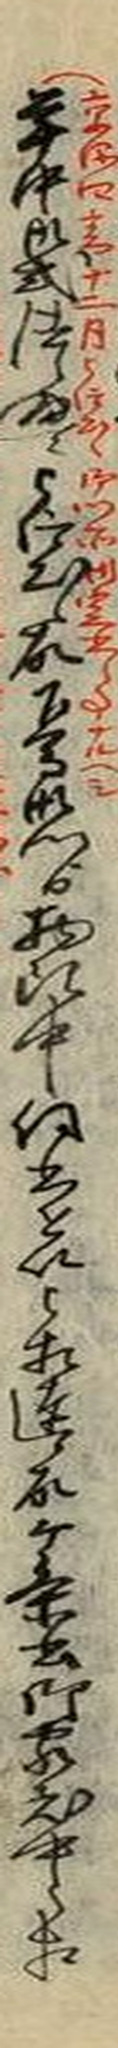年中御式法之通に被仰出候故下馬御門ゟ物頭中伺書を以被相達候故ヶ条書御家老中へ相
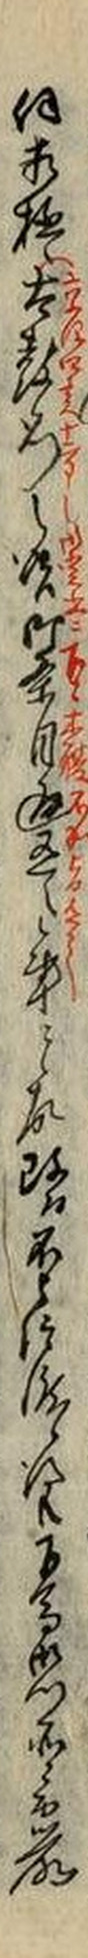伺相極候太鼓御門之儀は御条目通有之候事に候故改而不被仰渡候得共下馬御門所に而厳
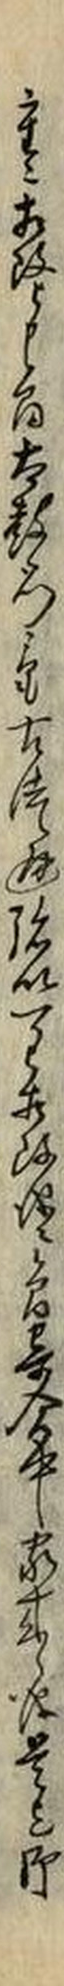重に相改被申候間太鼓御門に而も古法之通弥以可被相改儀に候間寄合中家来之儀是迄御
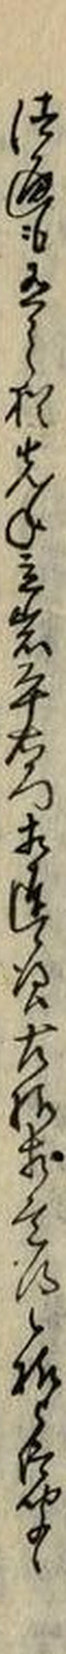法通も有之候猶先年立岩平右衛門相達候得は左様相意得候様被仰聞候
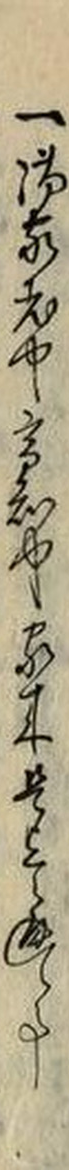一御家老中高知中家来是迄之通候事
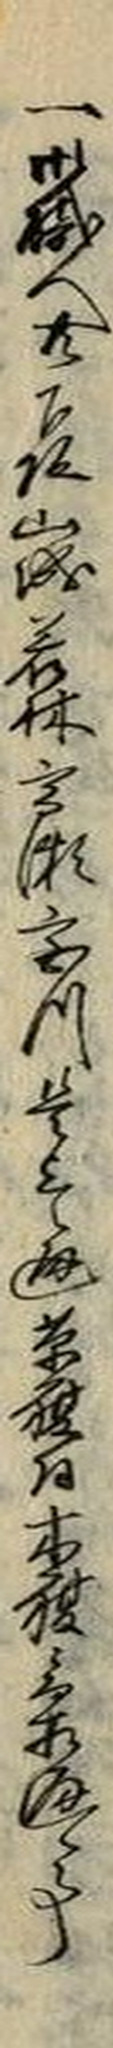一御職人共下坂山城若林高瀬宮川是迄之通草履付木履に而相通候事
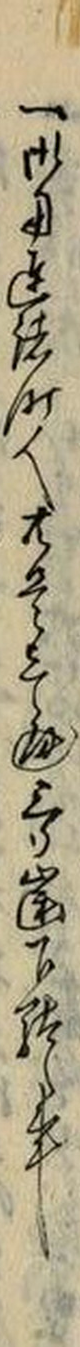一御用達諸町人共是迄之通三ツ歯下駄之事
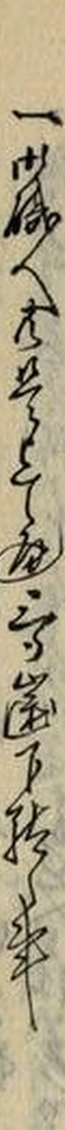一御職人共是迄之通三ツ歯下駄之事
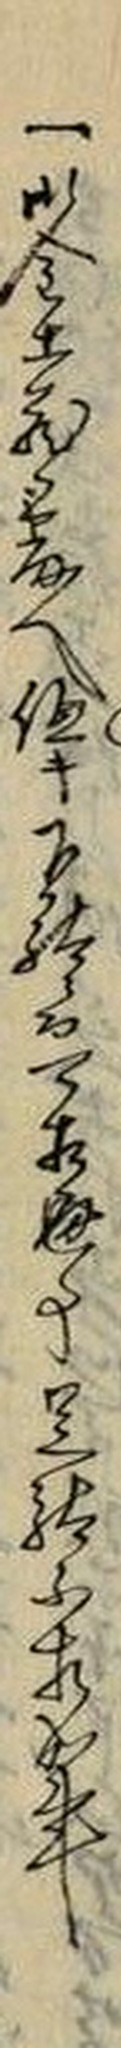一御金土蔵御番人低き下駄に而可相通候事足駄不相成事
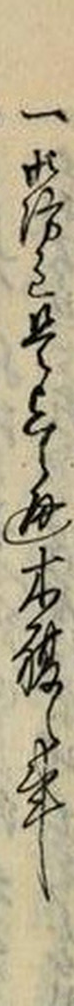一御坊主是迄之通木履之事
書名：御門御櫓之部
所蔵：福井県文書館 Fukui Prefectural Archives
